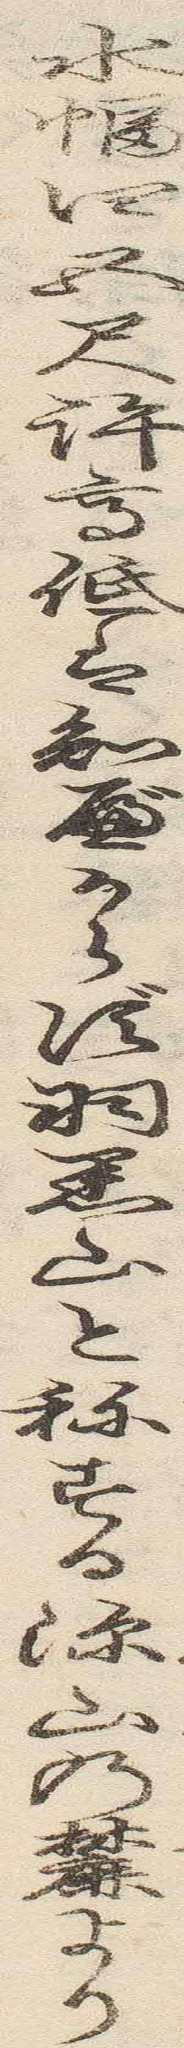水幅四五尺許高低は知べからず羽黒山と称する深山の麓より
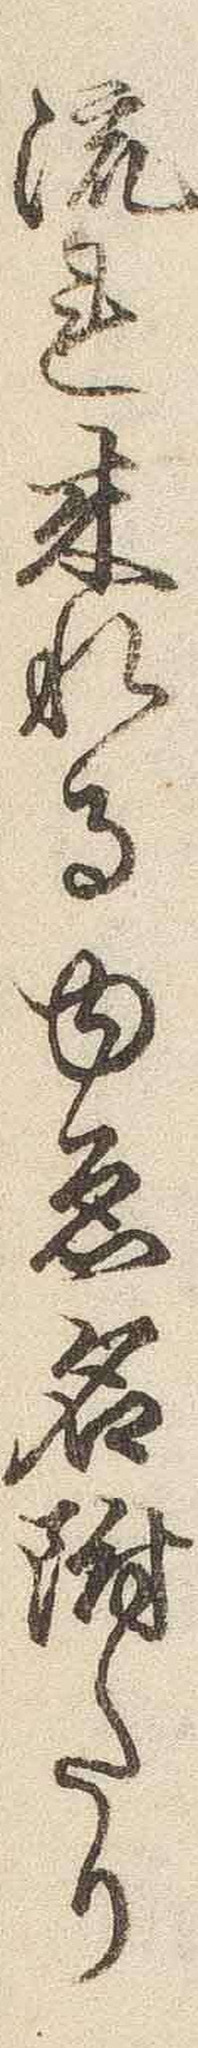流れ來れるゆゑ名附たり
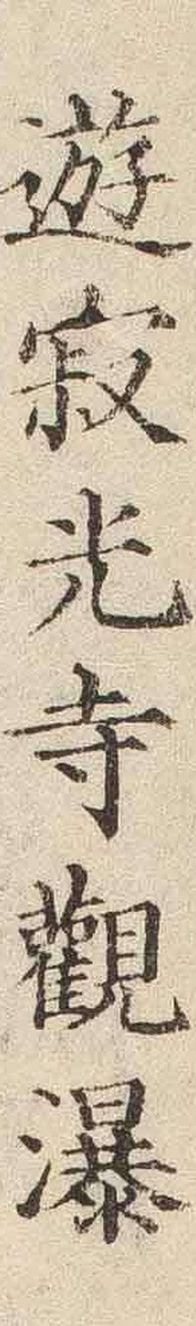遊寂光寺觀瀑
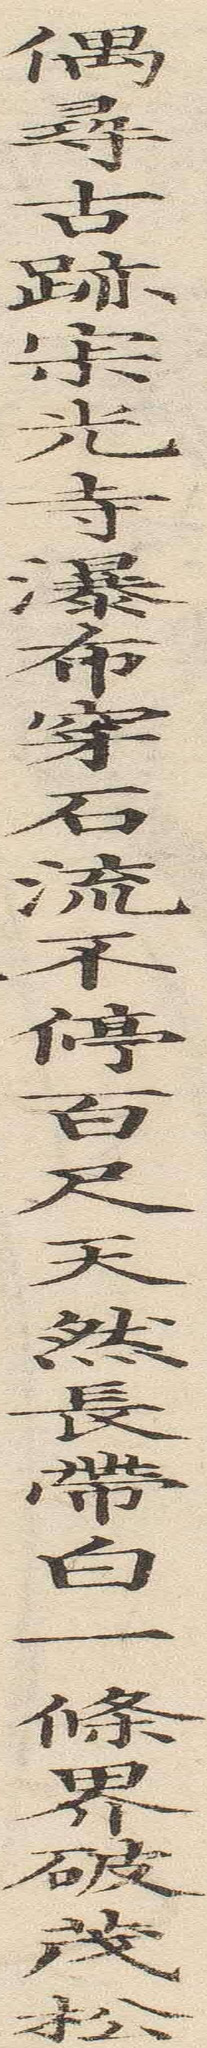偶尋古跡光寺瀑布穿石流不停百尺天然長帶白一條界破茂松
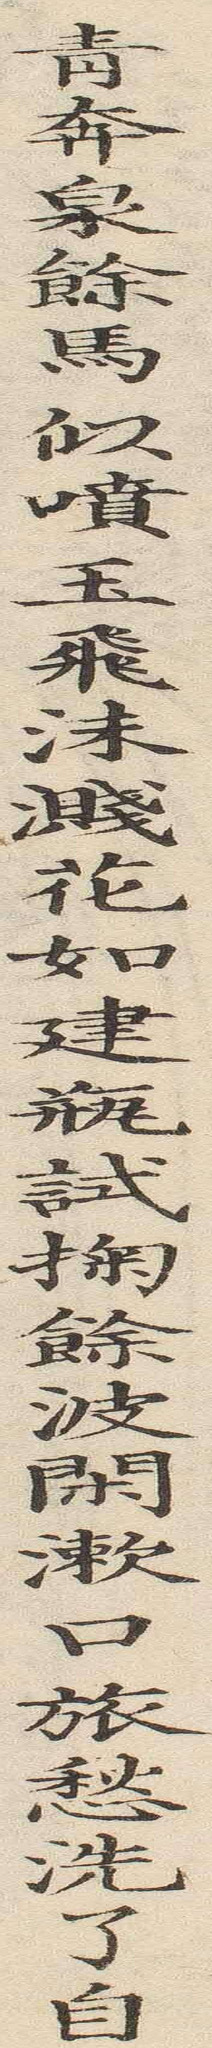靑奔泉餘馬似噴玉飛沫濺花如建瓶試掬餘波閑漱口旅愁洗了自
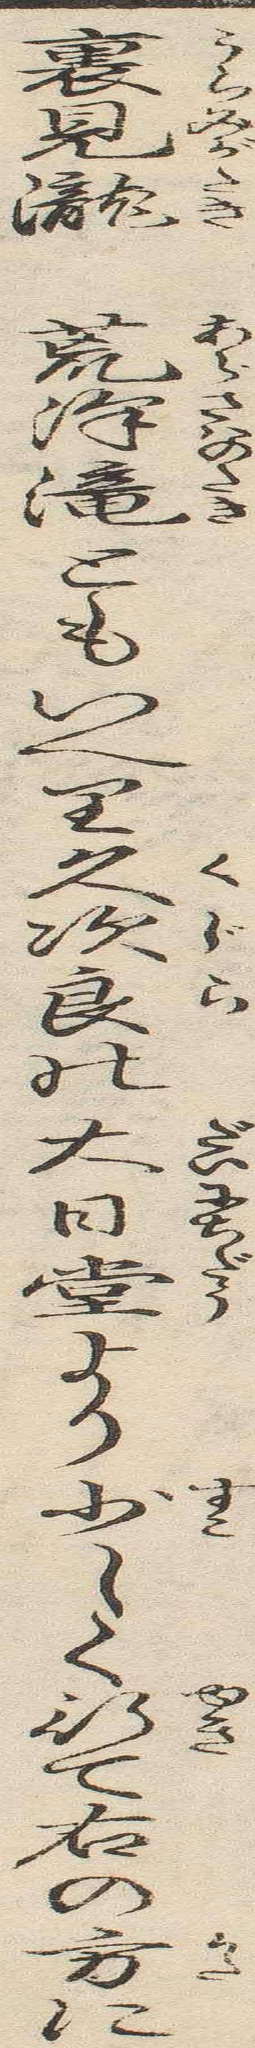裏見瀧荒澤滝ともいへり久次良の大日堂より少しく行て右の方に
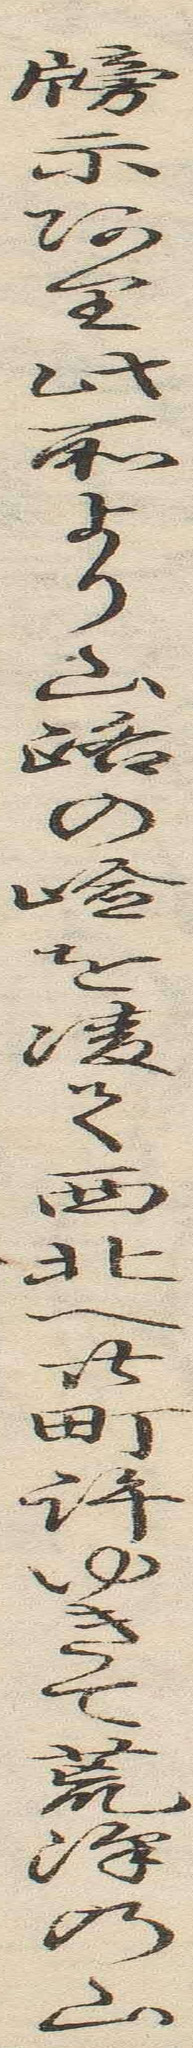牓示あり此所より山路の嶮を凌て西北へ廿町許ゆきて荒澤の山
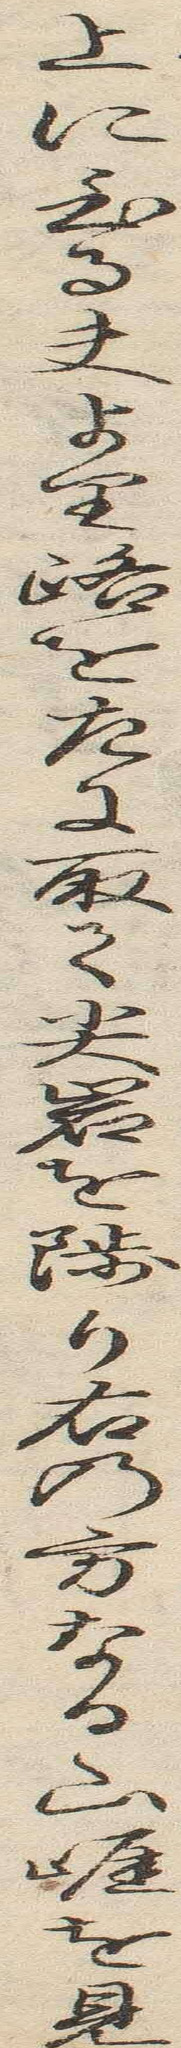上に至る夫より路を左に取て尖岩を陟り右の方なる山崕を見
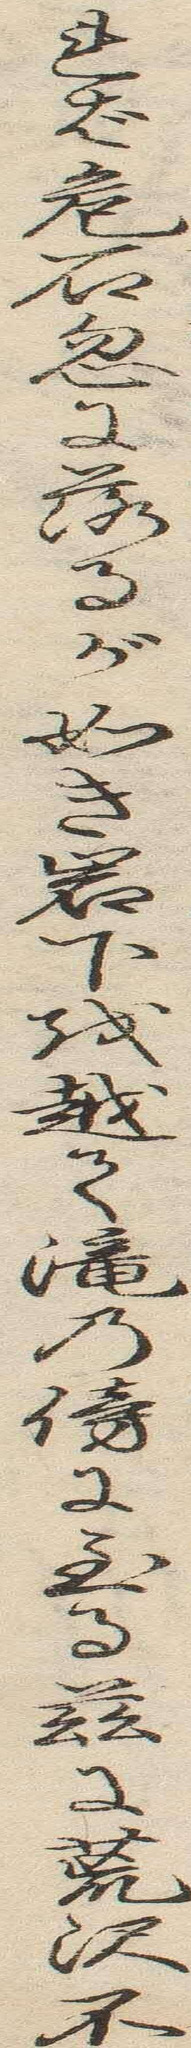れば危石忽に落るが如き岩下を越て滝の傍に至る兹に荒沢不
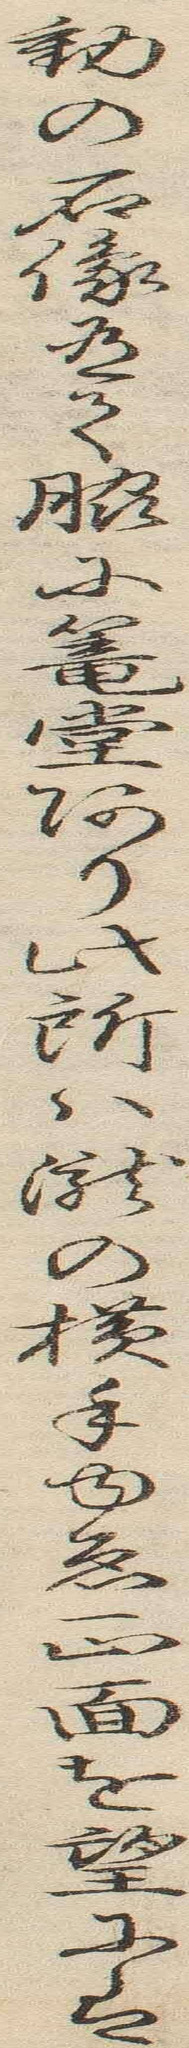動の石像有て脇に篭堂あり此所は瀧の横手ゆゑ正面を望には
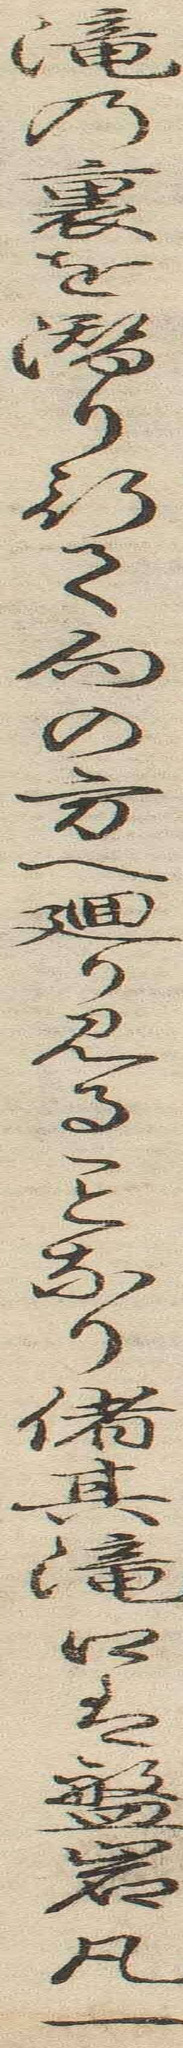滝の裏を潜り行て向の方へ廽り見ることなり偖其滝口は盤岩凡一
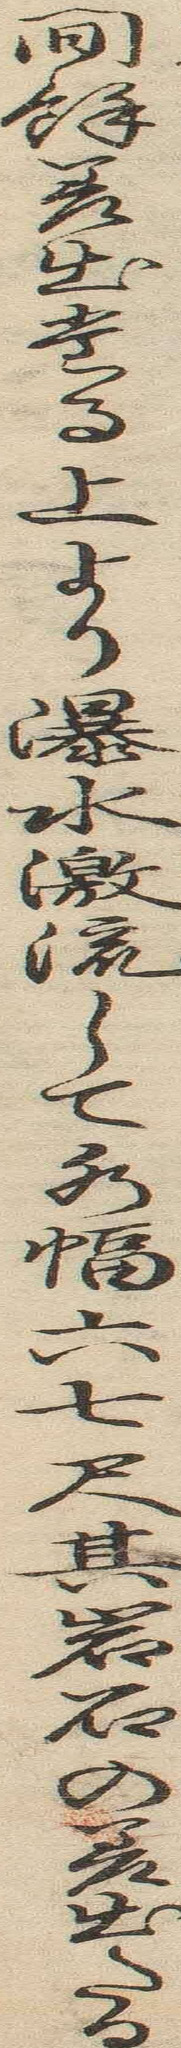間餘差出たる上より瀑水激流して水幅六七尺其岩石の差出たる

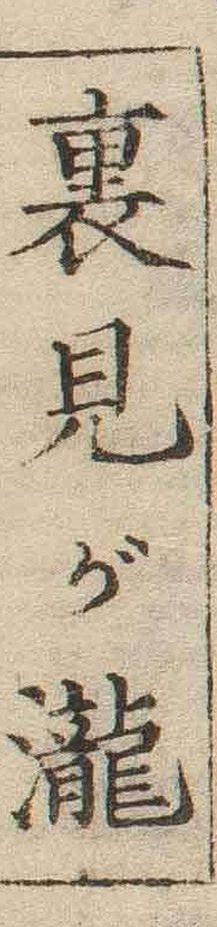裏見が瀧

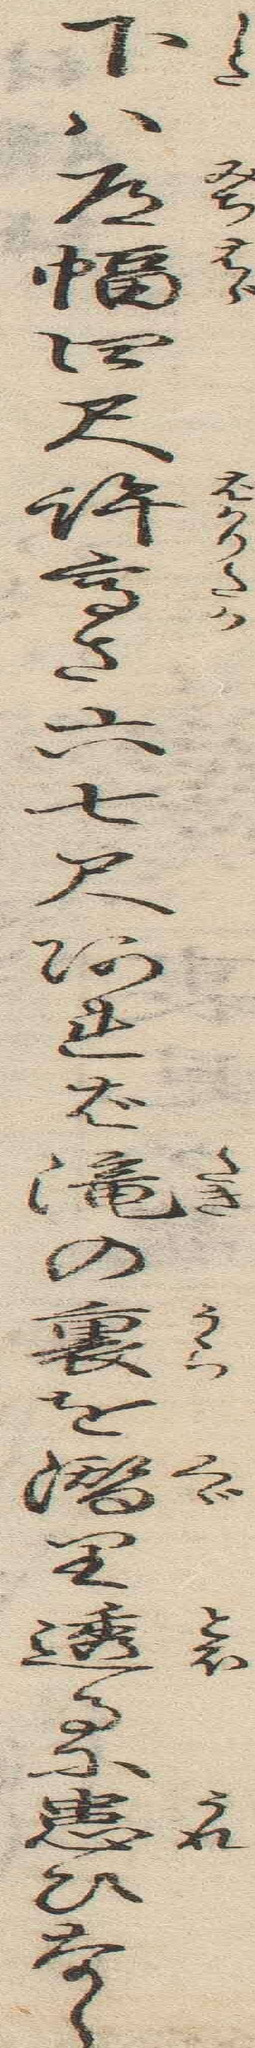下は道幅四尺許高さ六七尺あれば滝の裏を潜り透るに患ひなし
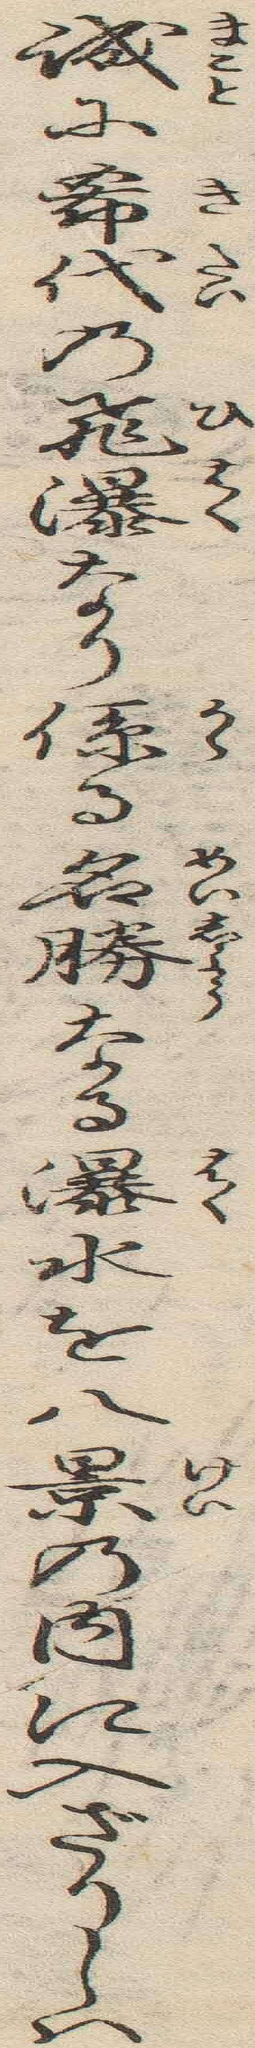誠に希代の飛瀑なり係る名勝なる瀑水を八景の内に入ざりしは
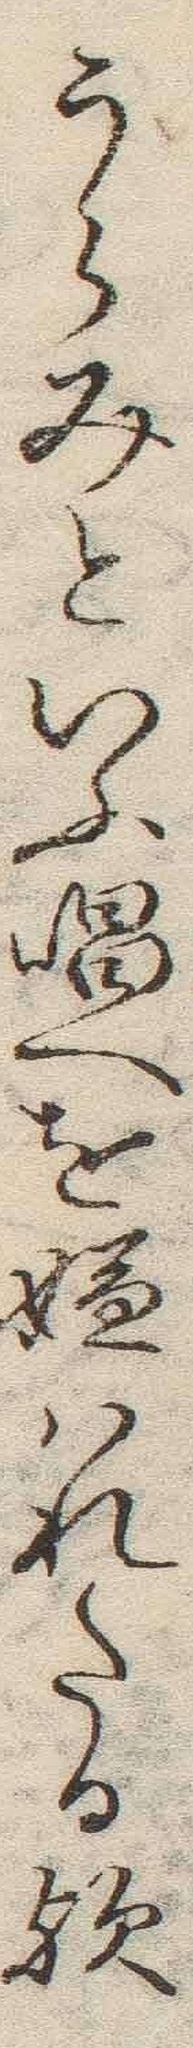うらみといふ唱へを嫌はれたる欤
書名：日光山志
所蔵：東京学芸大学附属図書館 国文学研究資料館
